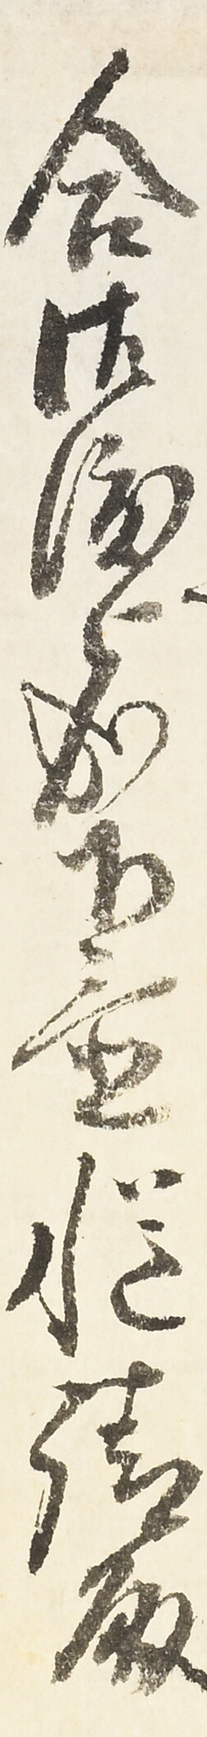合御渡被成下置慥請取
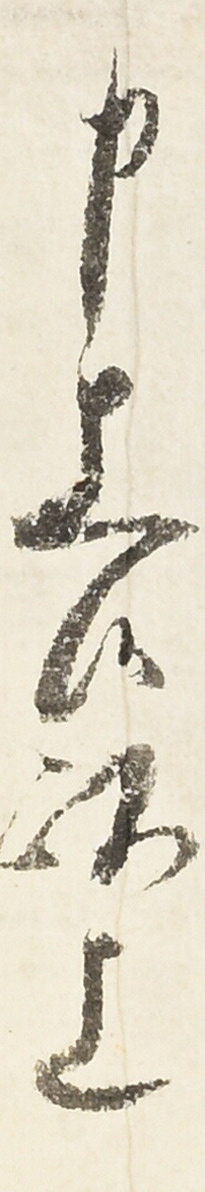申上候以上
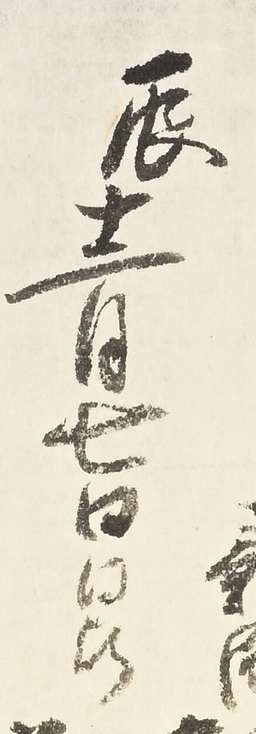十二月七日同断
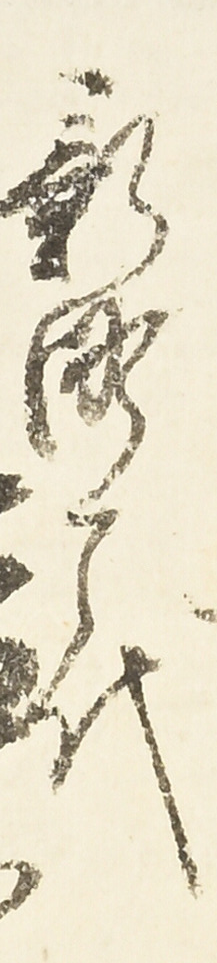新町丁代
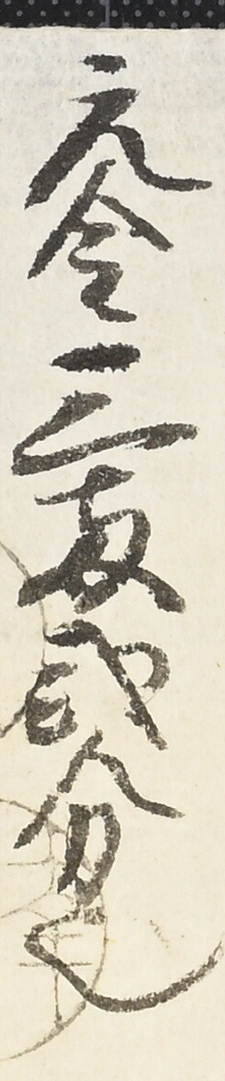元金三両弐分也
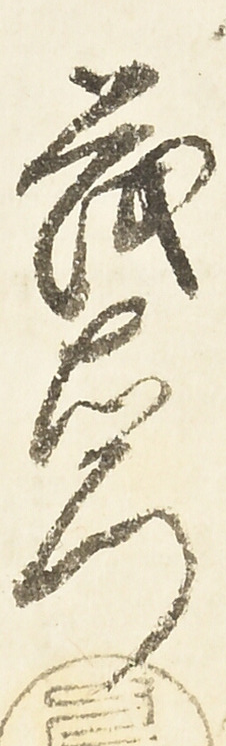茂右衛門
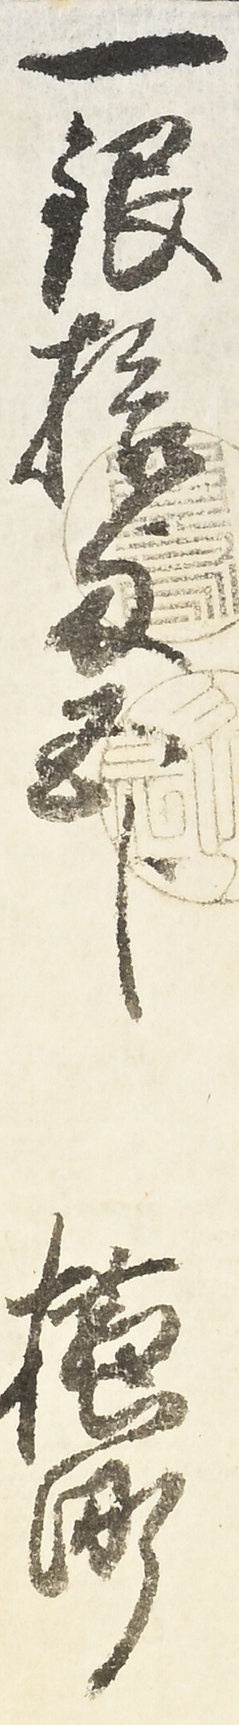一銀拾匁五分横町
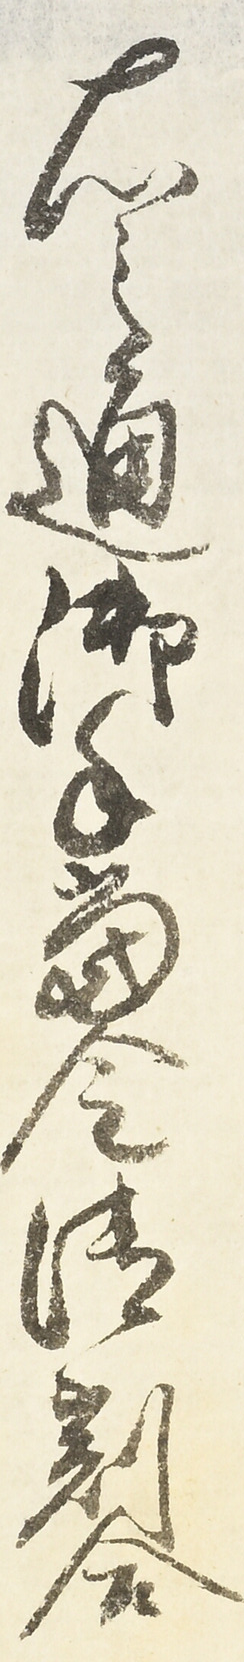右之通御手当金御割合
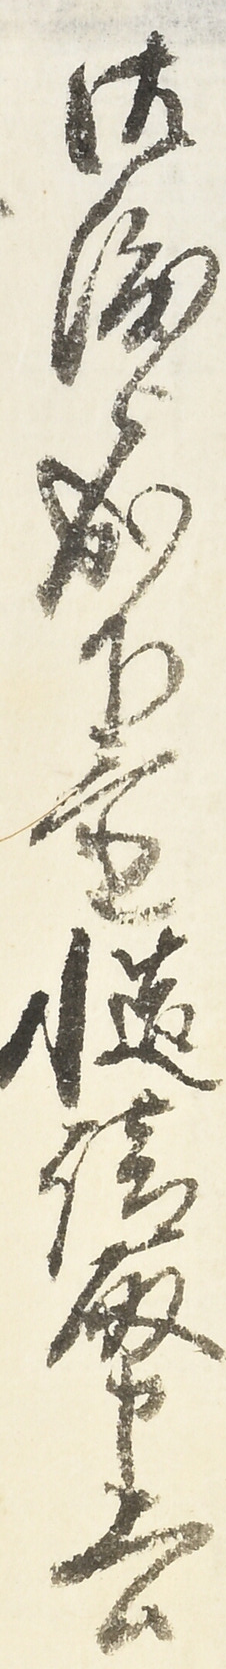御渡被成下置慥請取申上候
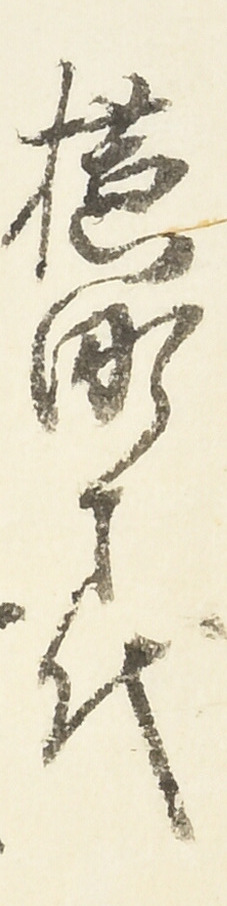横町丁代
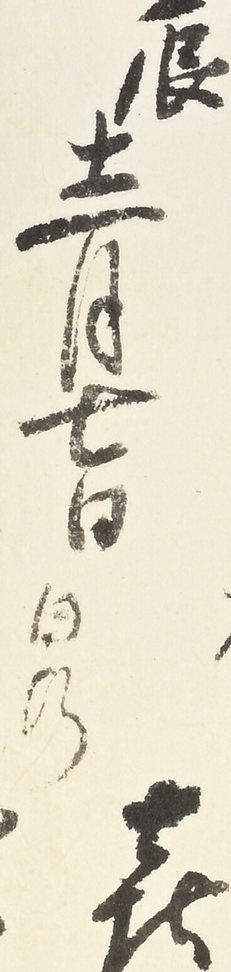十二月七日同断
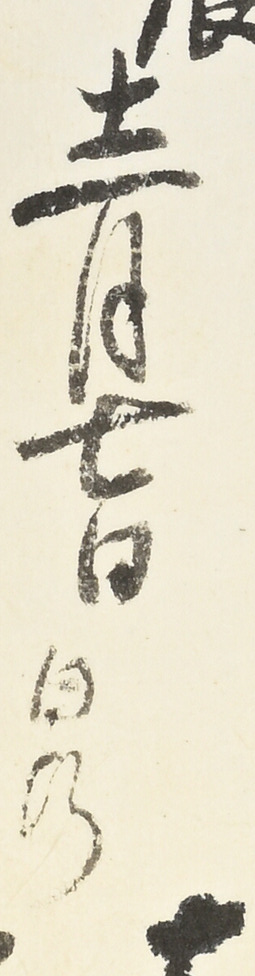十二月七日同断
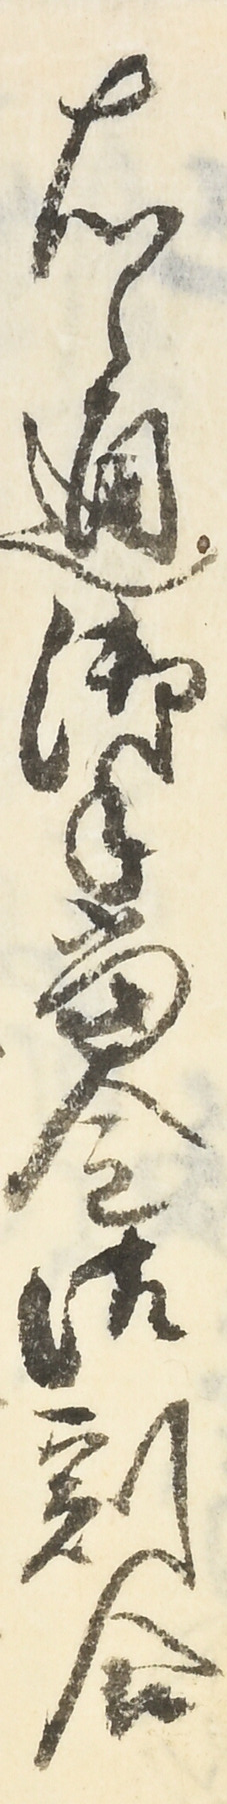右之通御手当金御割合
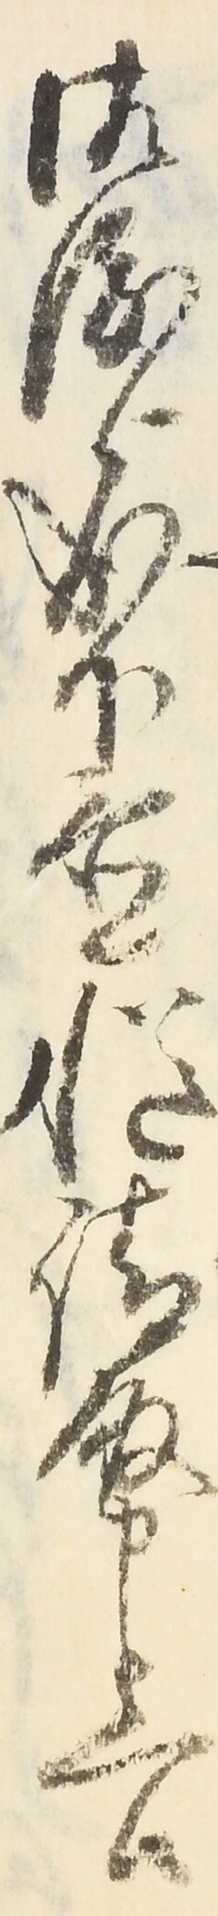御渡被成下置慥請取申上候

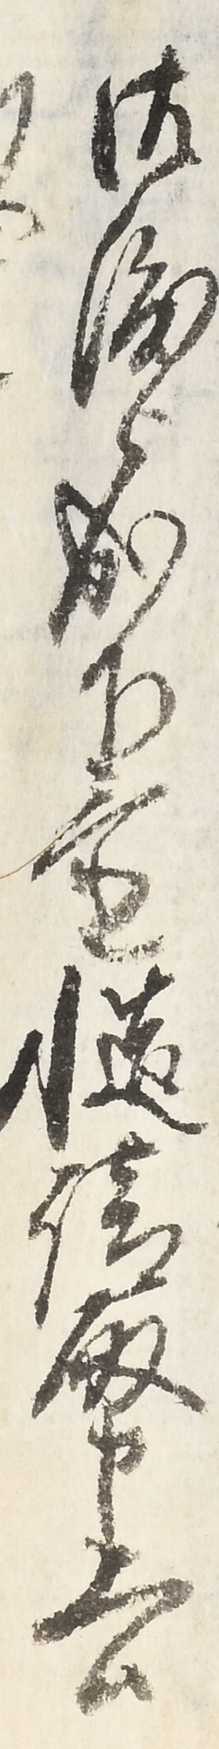御渡被成下置慥請取申上候
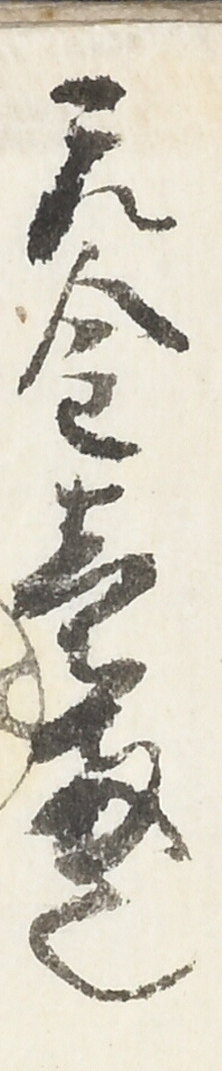元金壱両也
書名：御才覚金御利足割渡扣帳
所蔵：伊那市立高遠町図書館・合同会社AMANE
